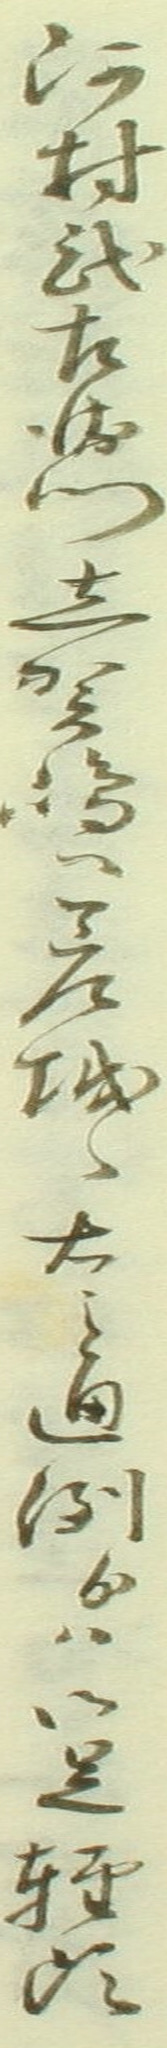河村武左衛門志賀島へ差越候右之通例ゟは御足軽頭
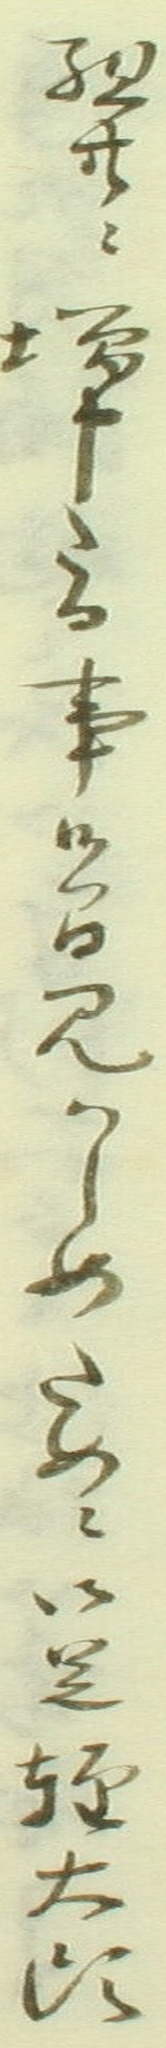組共に増申たる事候間見かしめために御足軽大頭
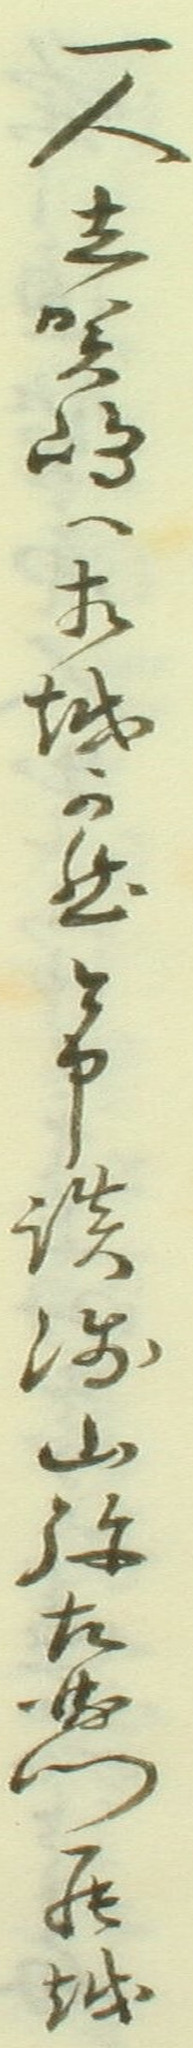一人志賀島へ相越可然と申談浅山弥左衛門罷越
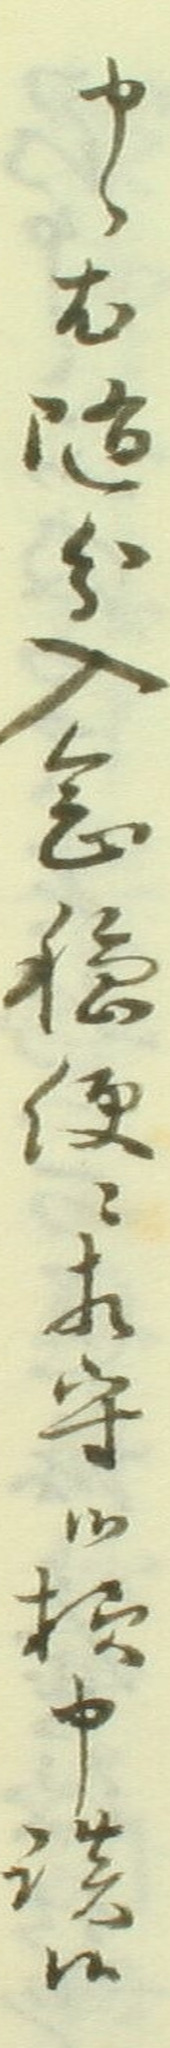申候尤随分入念穏便に相守候様申談候
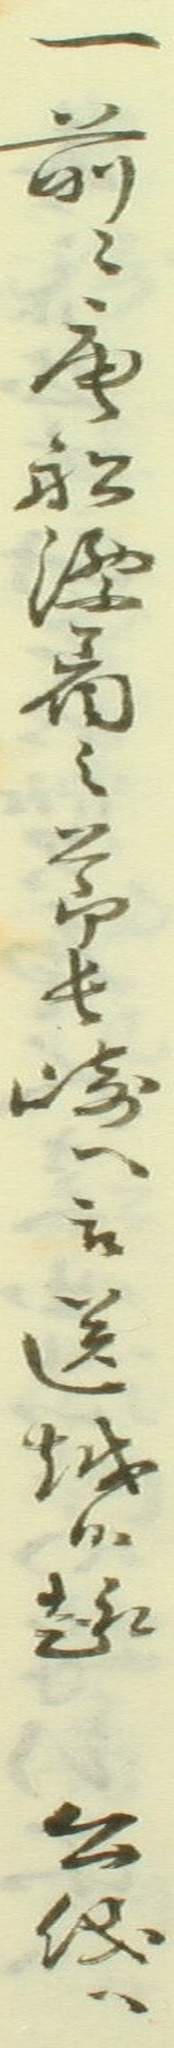一前々唐船漂着之節長崎へ被送越候趣公儀へ
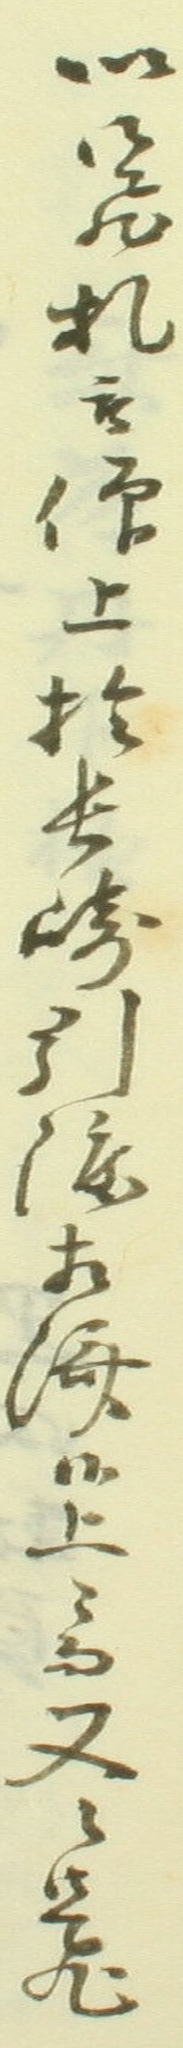以御飛札被仰上於長崎引渡相済候上に而又々御飛
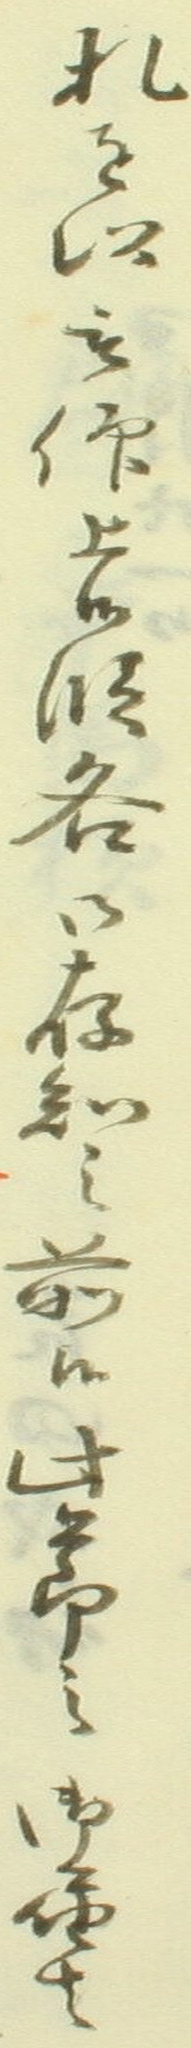札を以被仰上候段各御存知之前候此節之御届は
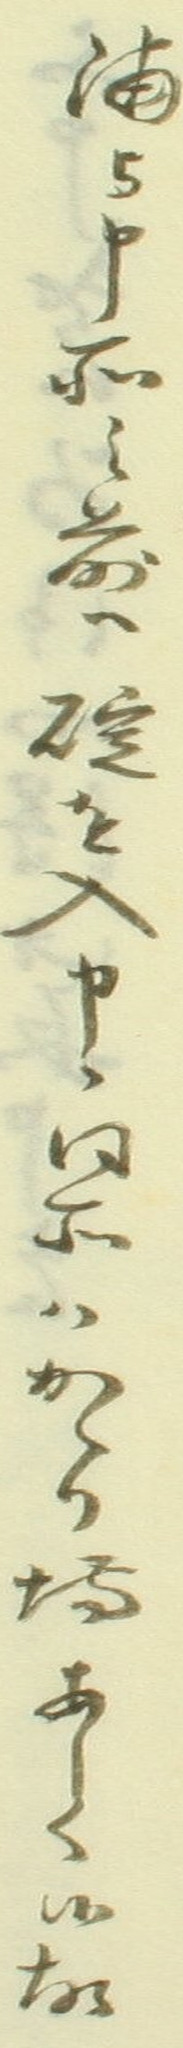浦与申所之前へ碇を入申候同所はかゝり場あしく候故
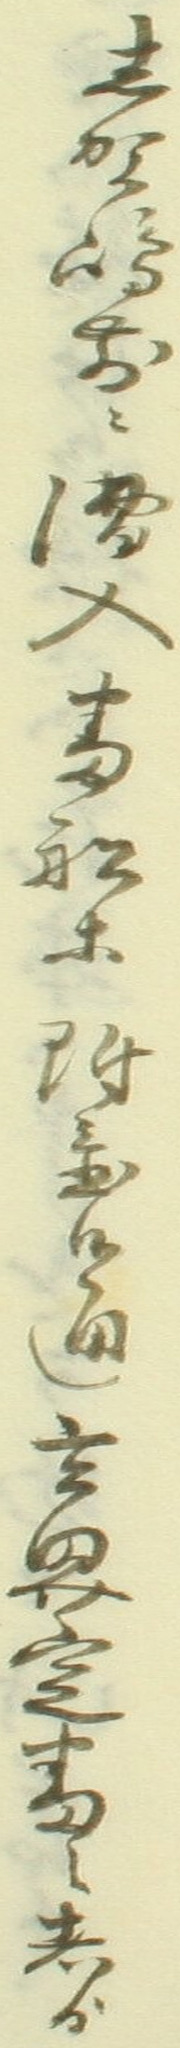志賀島前に漕入番船等附置候通玄界定番之者ゟ
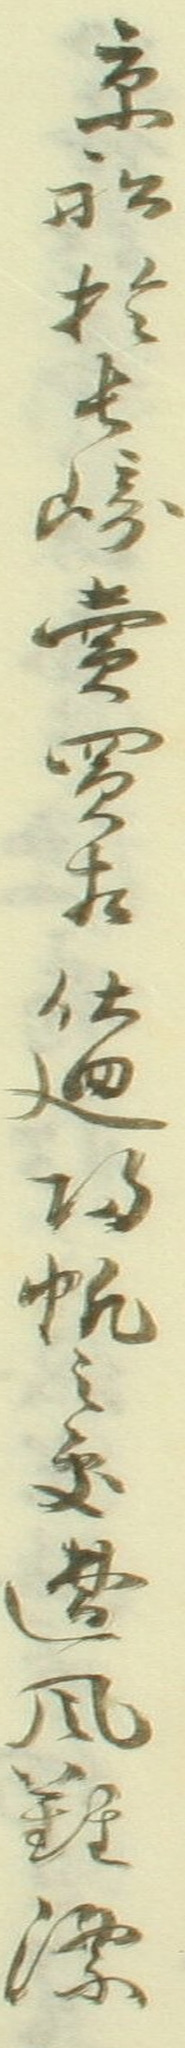京船於長崎売買相仕廻帰帆之処遭風難漂
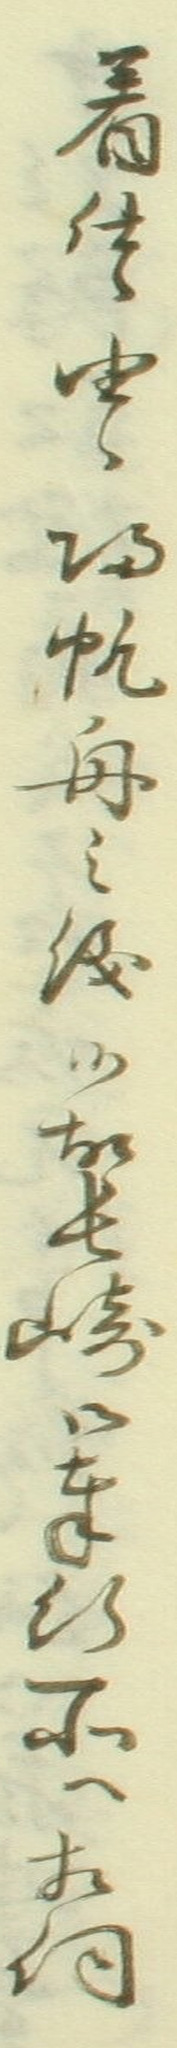着仕候由候帰帆舟之儀候故長崎奉行所へ相伺
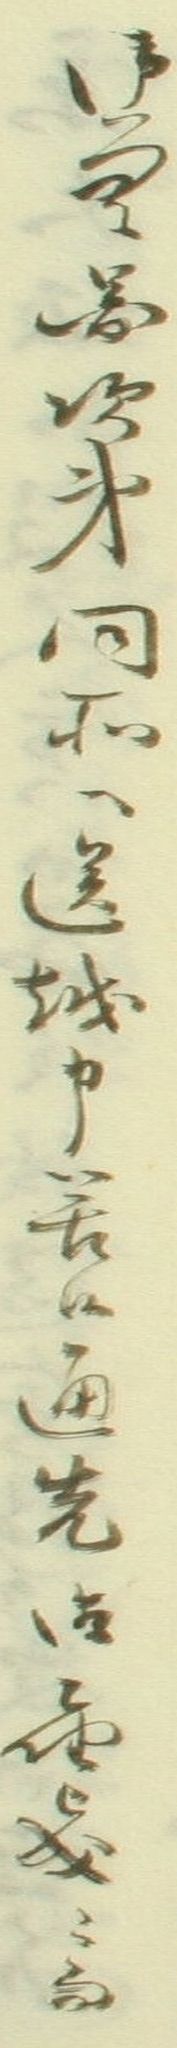御差図次第同所へ送越申筈候通先御届被成に而
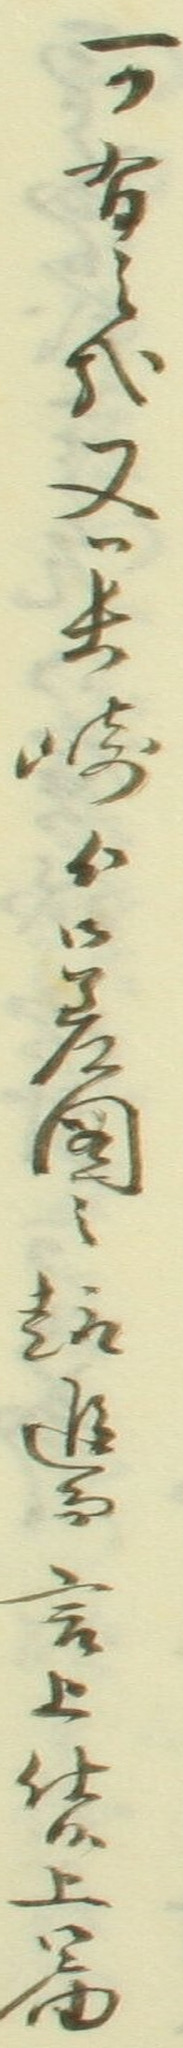可有之哉又は長崎ゟ御差図之趣追而言上仕候上御届

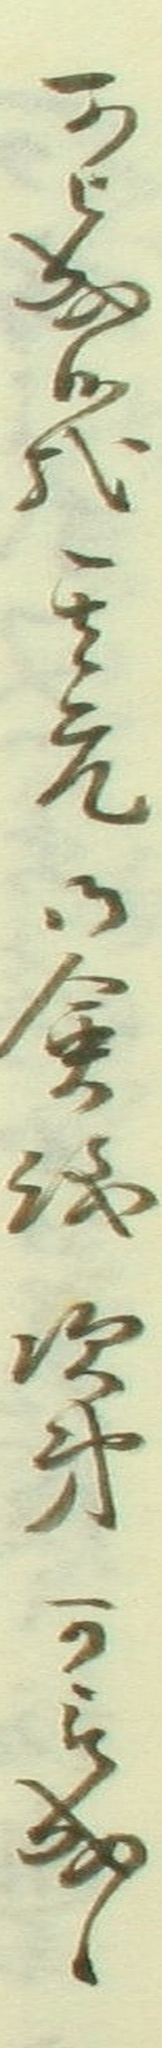可被成候哉其元御せ僉議次第可被成候
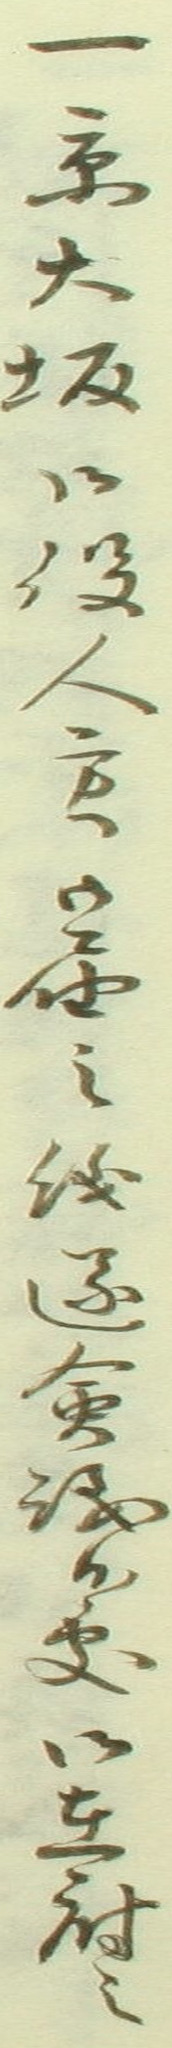一京大坂御役人方へ御届之儀遂僉議候処御在府之
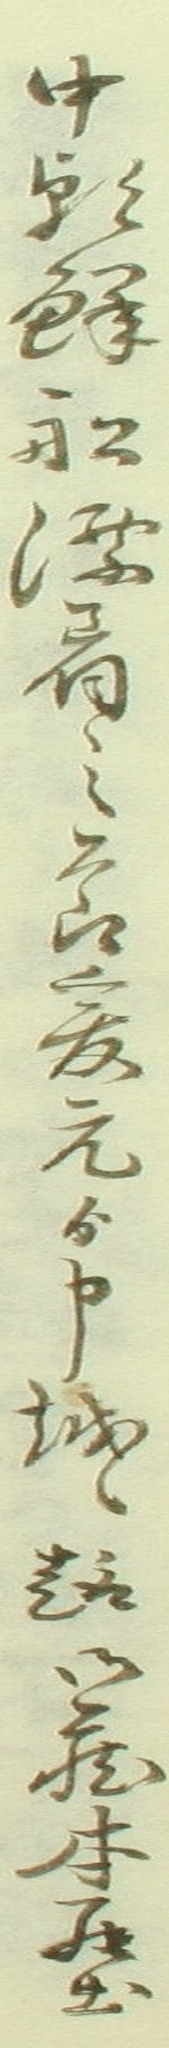中朝鮮船漂着之節爰元ゟ申越候趣御蔵本罷出
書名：異国船漂着記
